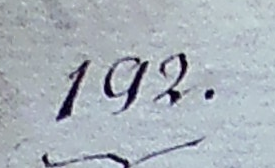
192.
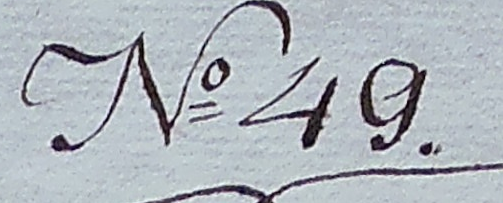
No͇ 49.
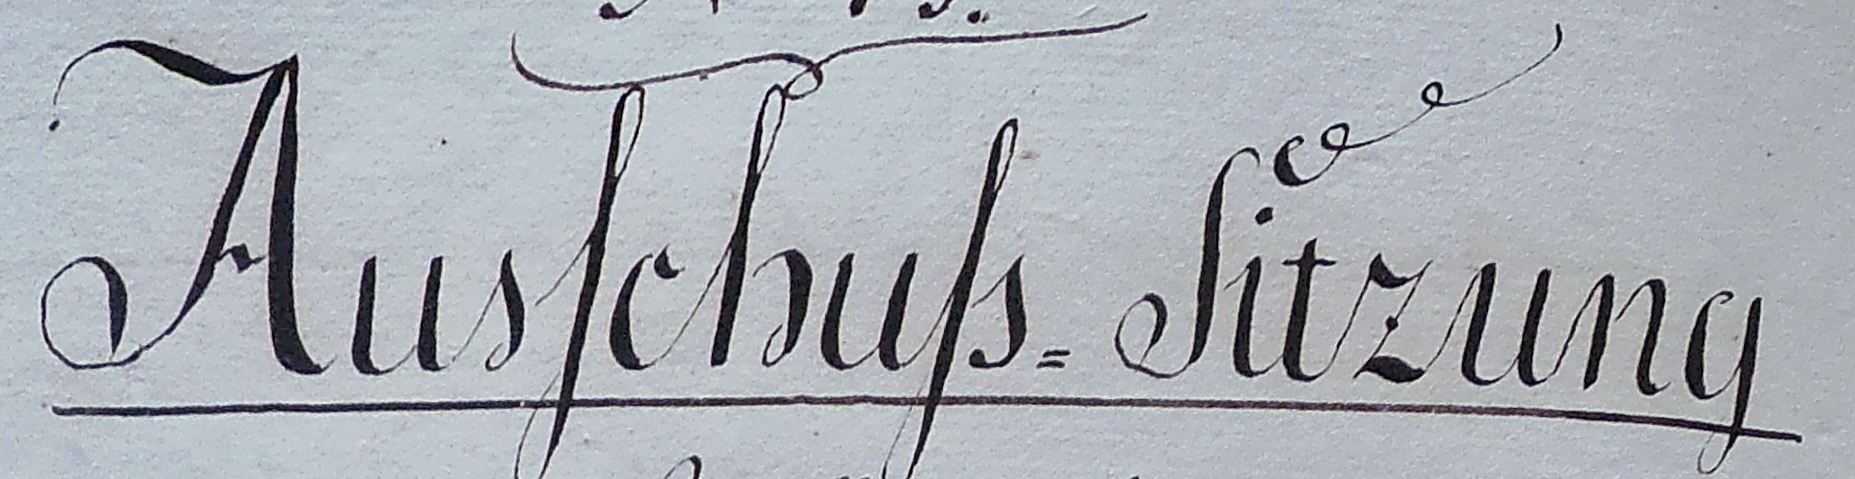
Ausschuss‗Sitzung
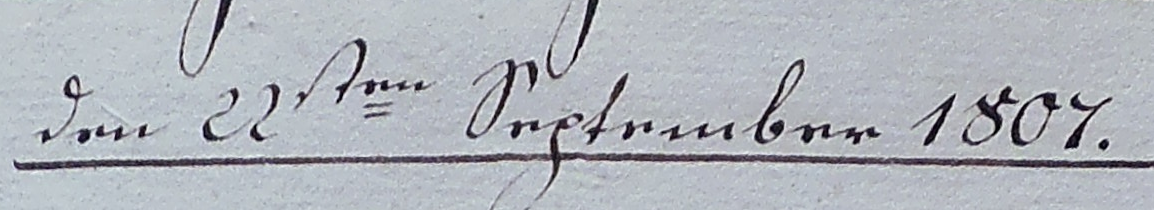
den 22te͇n September 1807.
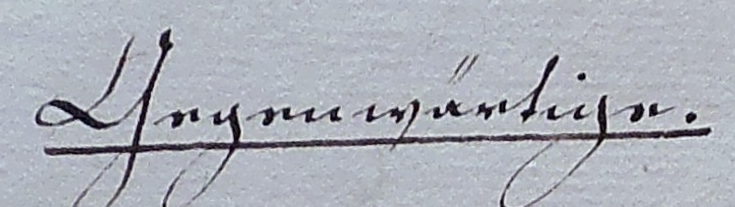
Gegenwärtige.
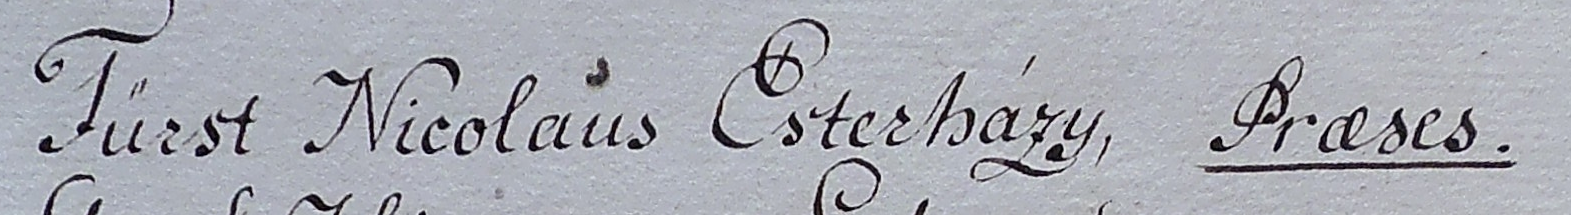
Fürst Nicolaus Esterházy, Præses.
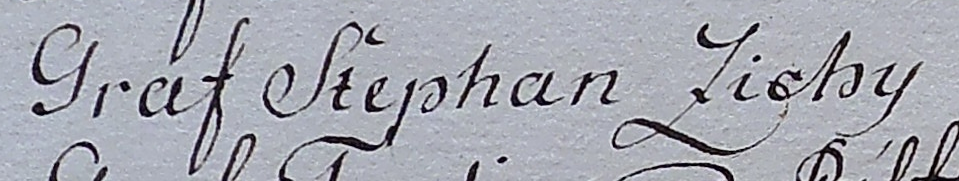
Graf Stephan Zichy
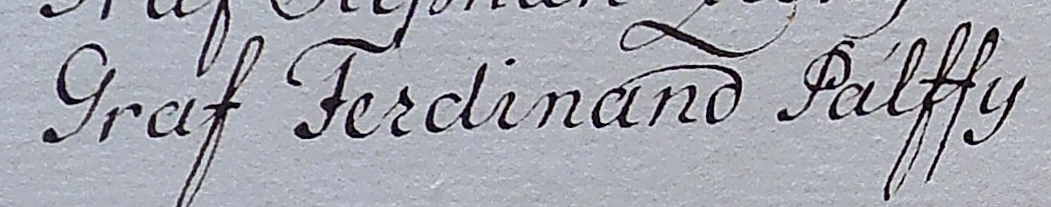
Graf Ferdinand Pálffy
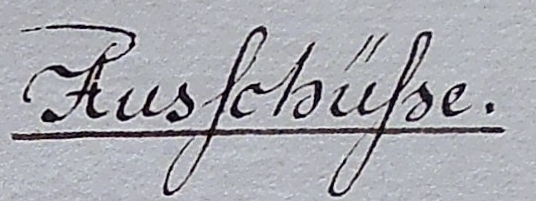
Ausschüsse.
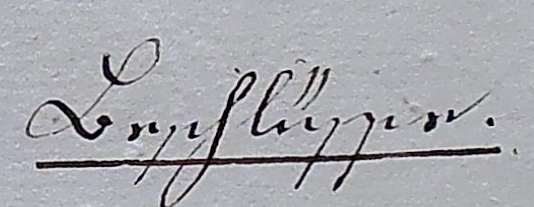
Beschlüsse.
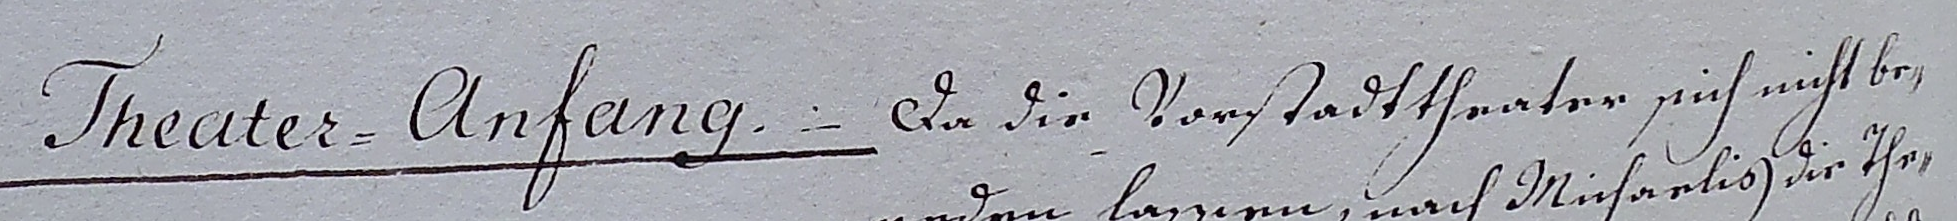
Theater‗Anfang. .. Da die Vorstadtheater sich nicht boe¬
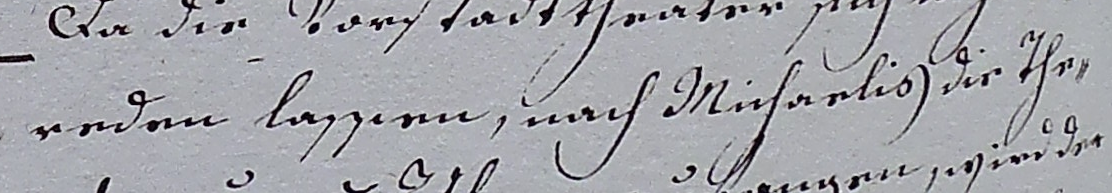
reden lassen, nach Michaelis die The¬
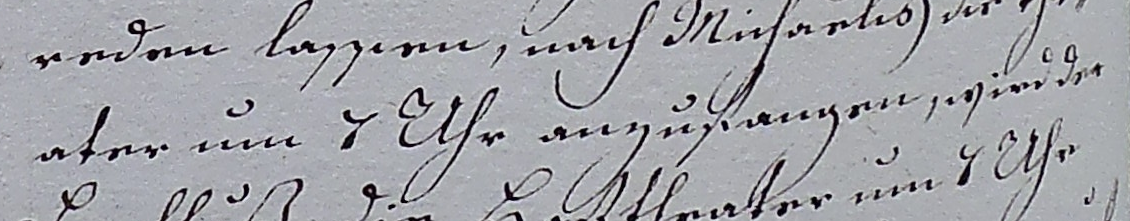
ater um 7 Uhr anzufangen, wird der
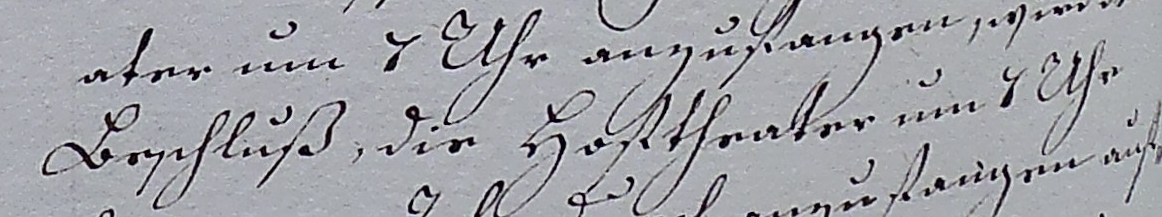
Beschluß, die Hoftheater um 7 Uhr
